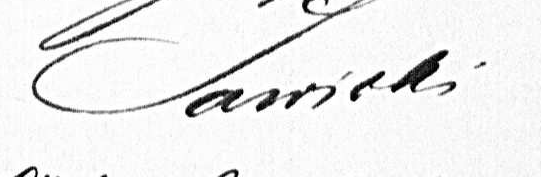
Sawicki
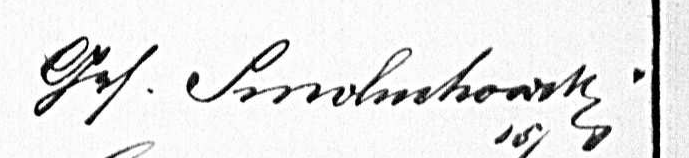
Ges. Smolmhoxx
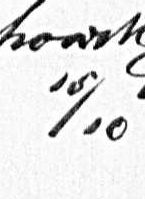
15/10
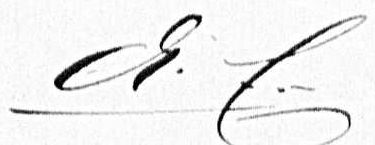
A. E.
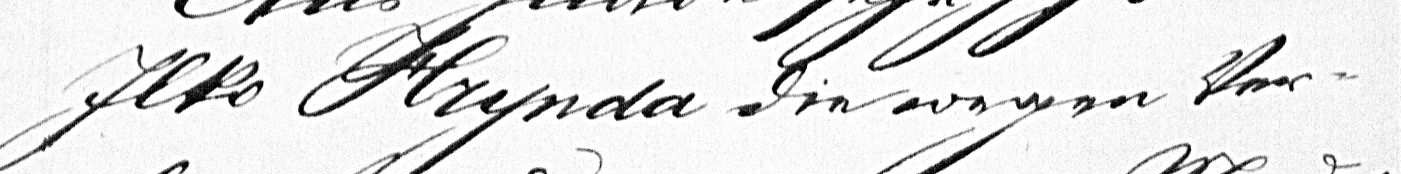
Jlko Hrynda die wegen Ver¬
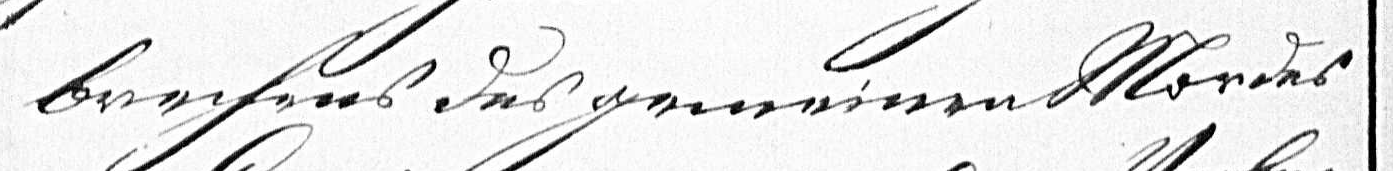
brechens des gemeinen Mordes
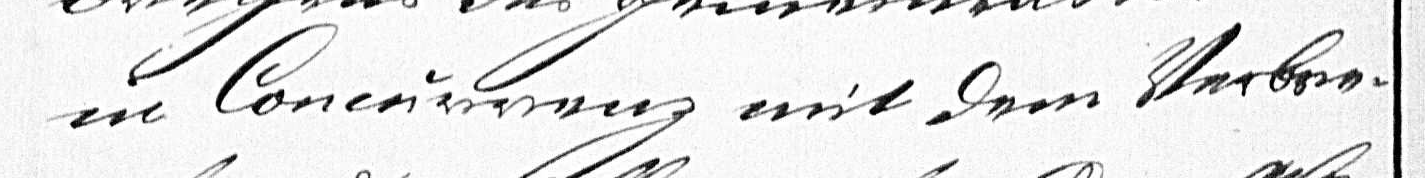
in Concurrenz mit dem Verbre¬
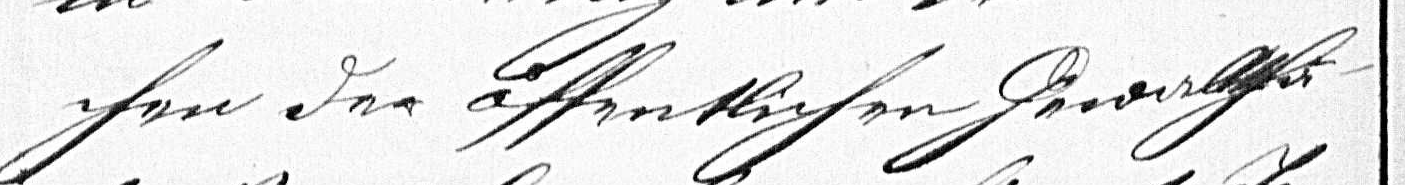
chen der öffentlichen Gewaxx¬
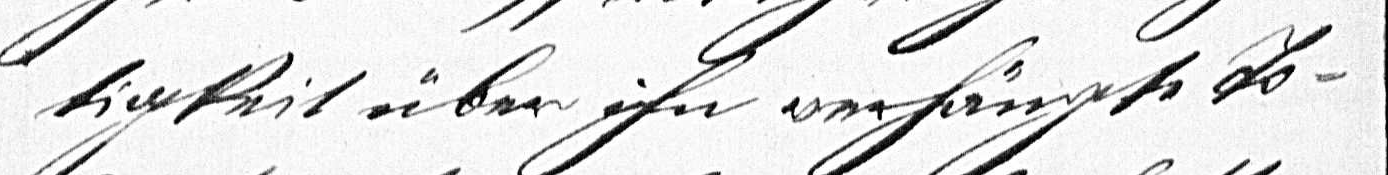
tigkeit über in verhängte To¬
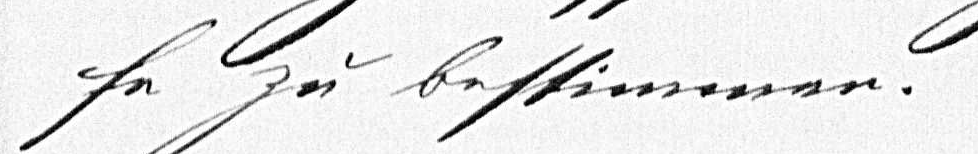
fe zu bestimmen.
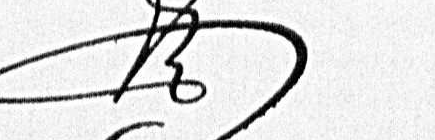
FL
